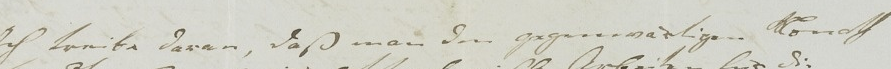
Ich treibe daran, daß man den gegenwärtigen Monath
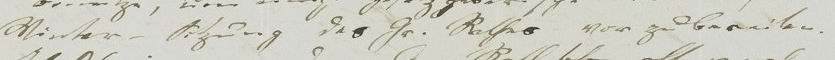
Winter-Sitzung des Gr. Rathes vorzubereiten.
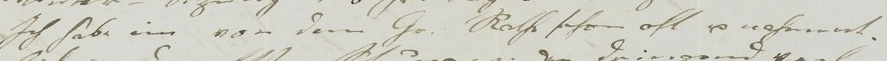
Ich habe ein von dem Gr. Rathe schon oft & nahment-
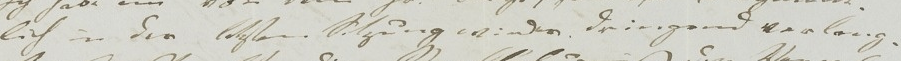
lich in der letzten Sitzung wieder dringend verlang-
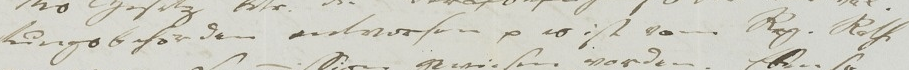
tungsbehörden entworfen & es ist vom Reg.Rathe
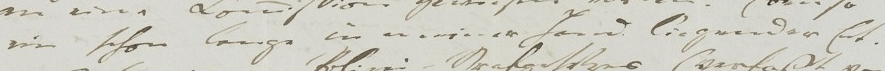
ein schon lange in meiner Hand liegender Ent-
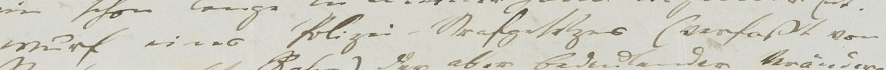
wurf eines Polizei-Strafgesetzes (verfaßt vom
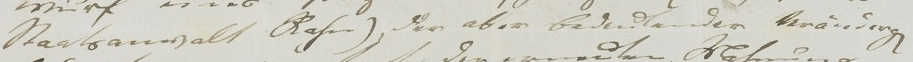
Staatsanwalt Rahn ), der aber bedeutender Veränderungen
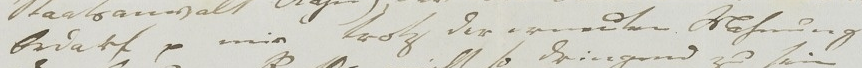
bedarf & mir trotz der erneuten Mahnung
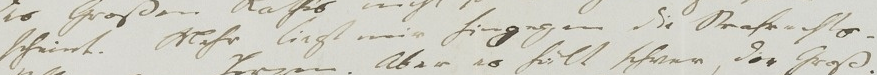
scheint. Mehr liegt mir hingegen die Strafrechts--
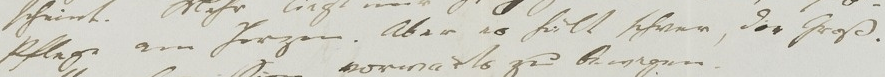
Pflege am Herzen. Aber es hält schwer, die Groß-
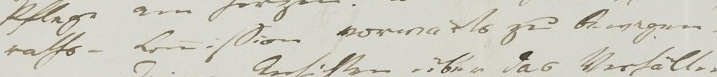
raths-Commission vorwärts zu bewegen.
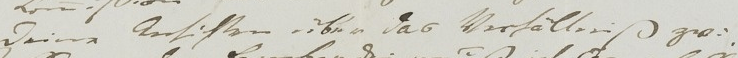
Deine Ansichten über das Verhältniß zwi-
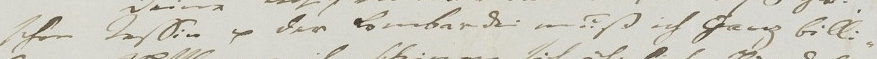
schen Tessin & der Lombardei muß ich ganz billi-
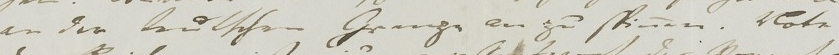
an der teutschen Grenze an zu spinnen. Note
